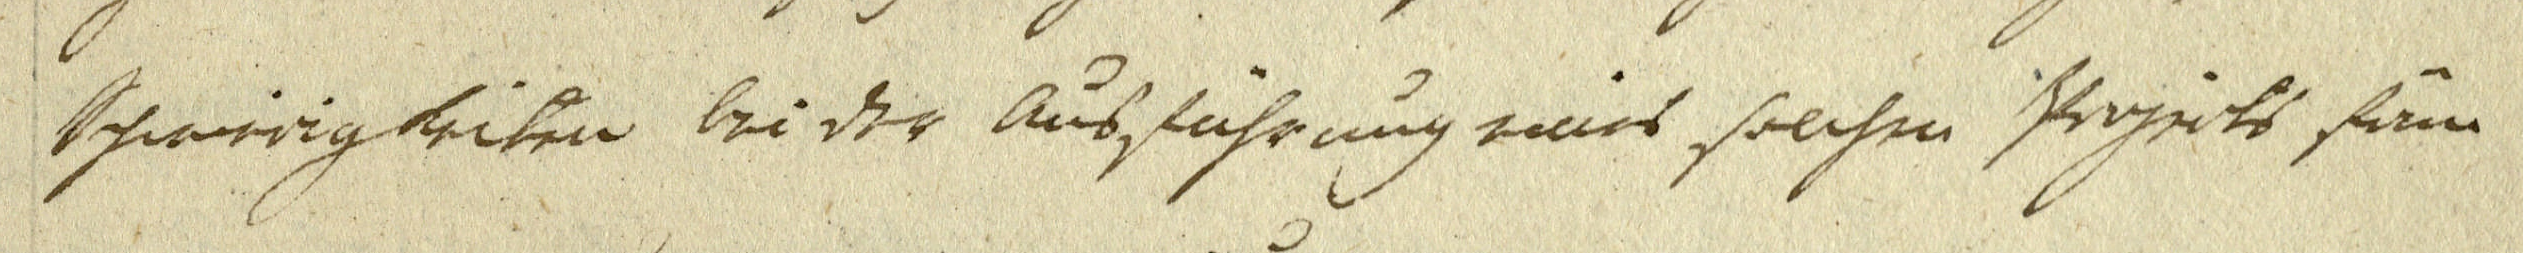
Schwierigkeiten bei der Ausführung eines solchen Projects fän¬
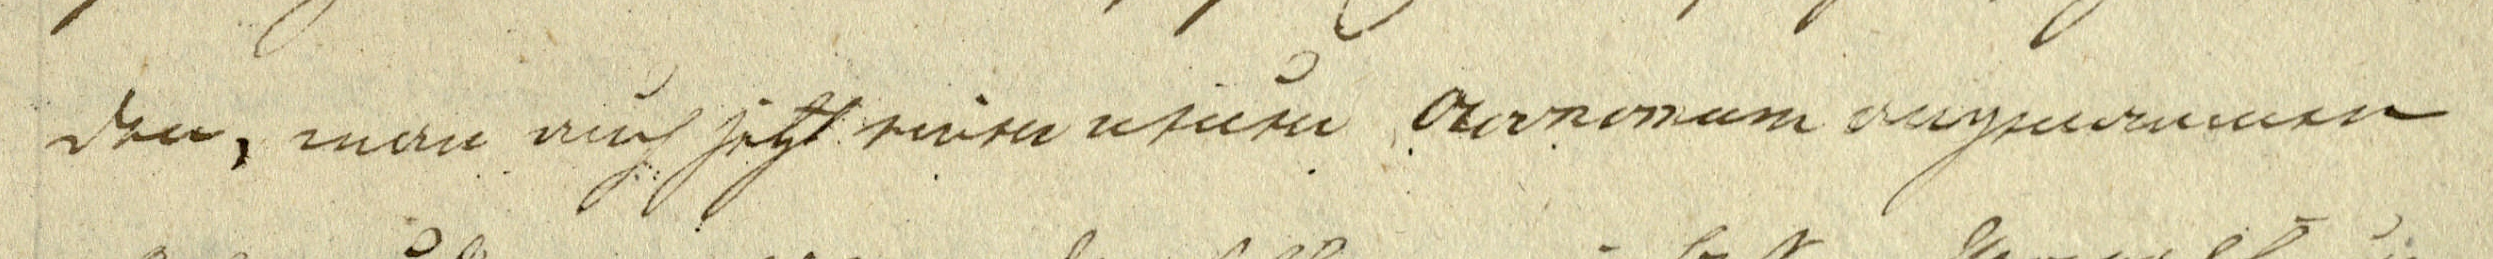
den, man auch jetzt einen neuen Oeconom angenommen
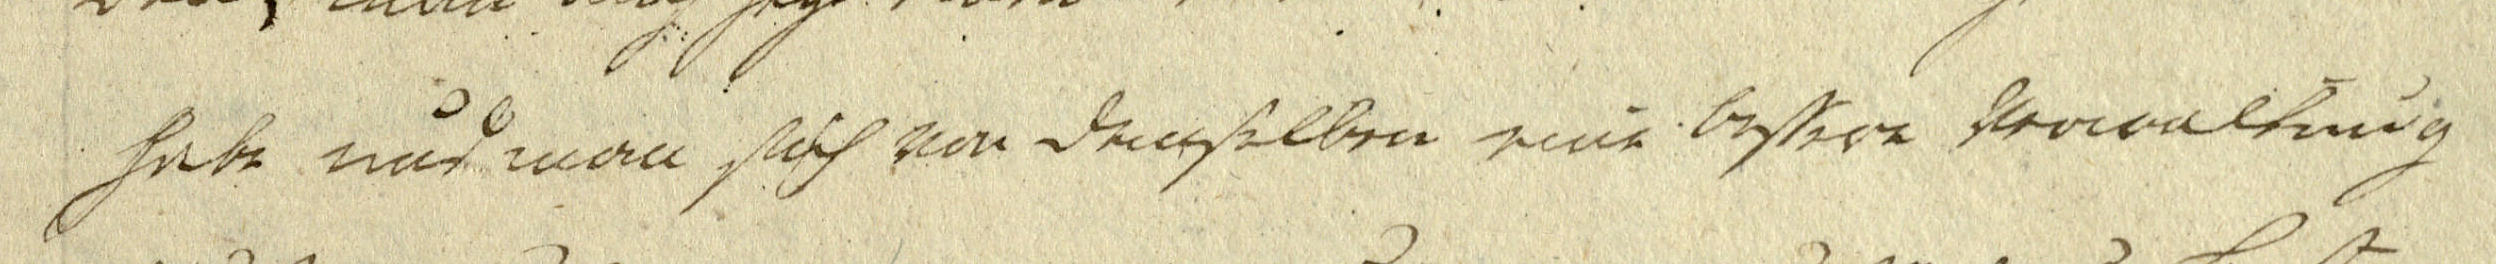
habe und man sich von demselben eine bessere Verwaltung
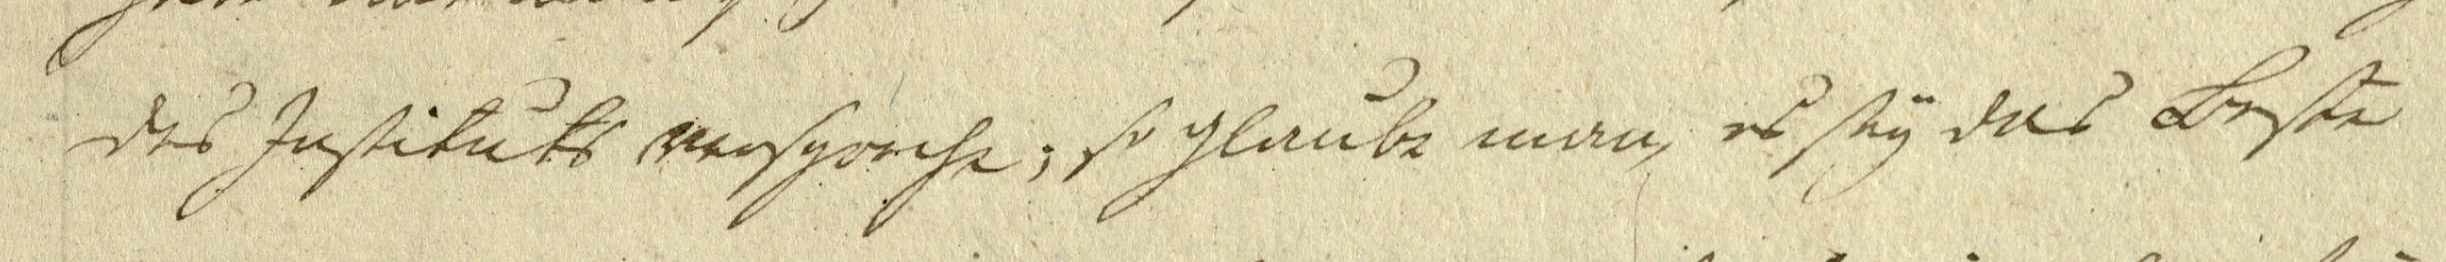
des Instituts verspreche, so glaube man es seÿ das Beste
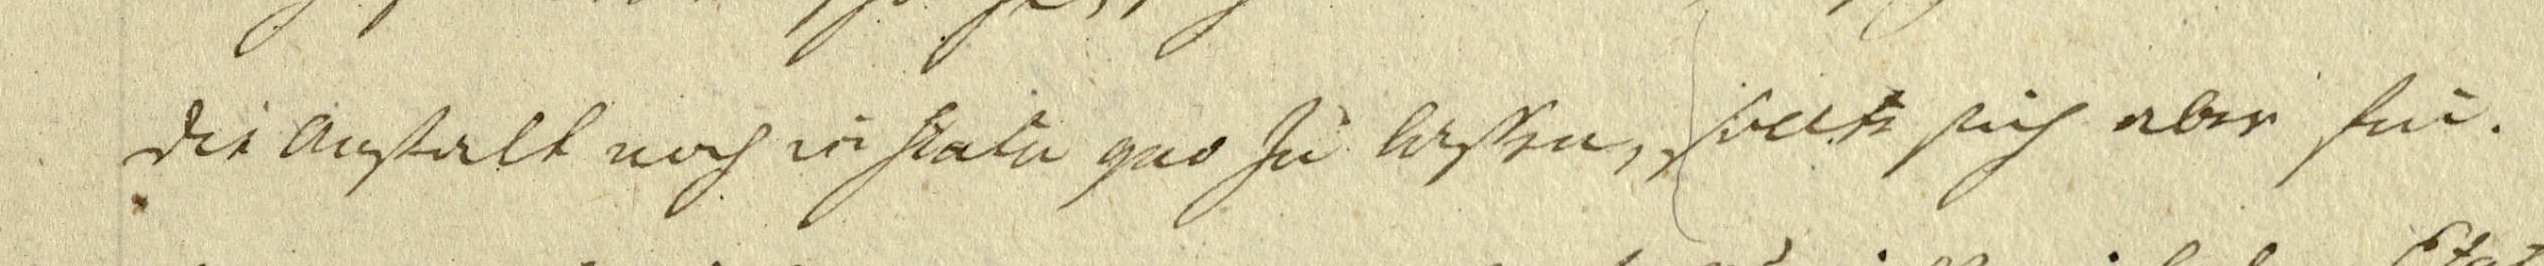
die Anstalt noch in statu quo zu lassen, sollte sich aber fin¬
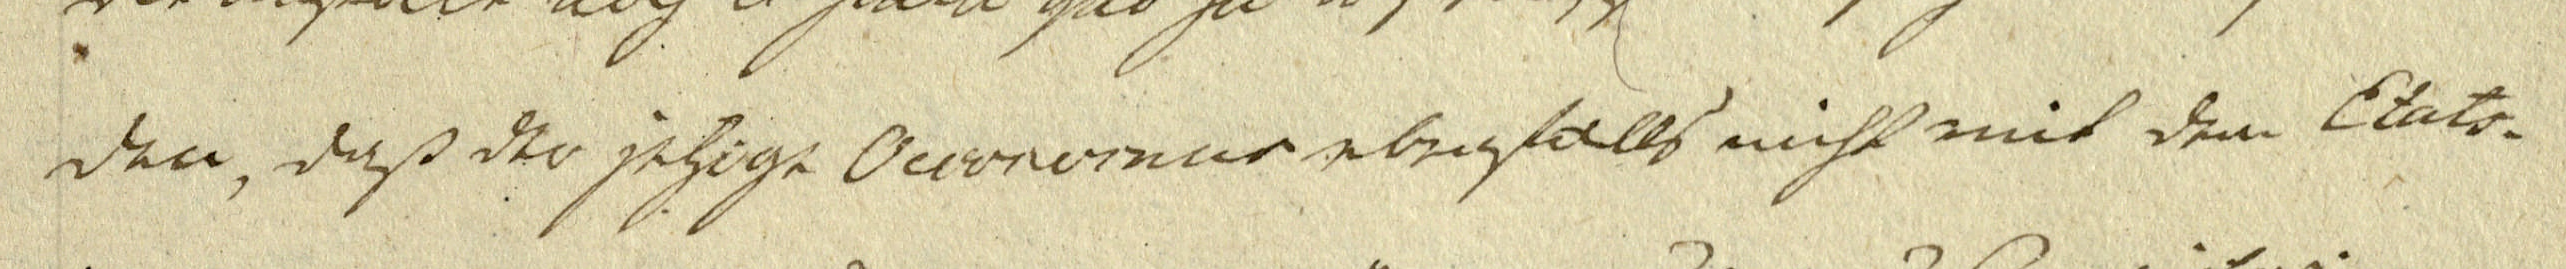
den, daß der jetzige Oeconomus ebenfalls nicht mit dem Etats¬
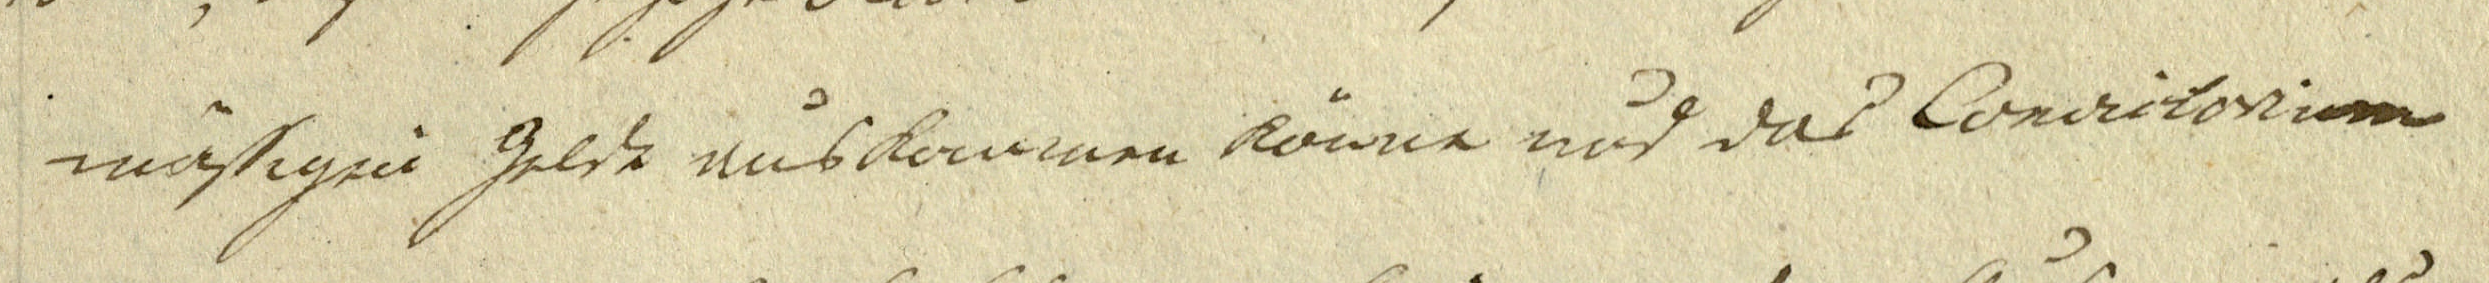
mässigen Gelde auskommen könne und das Convictorium
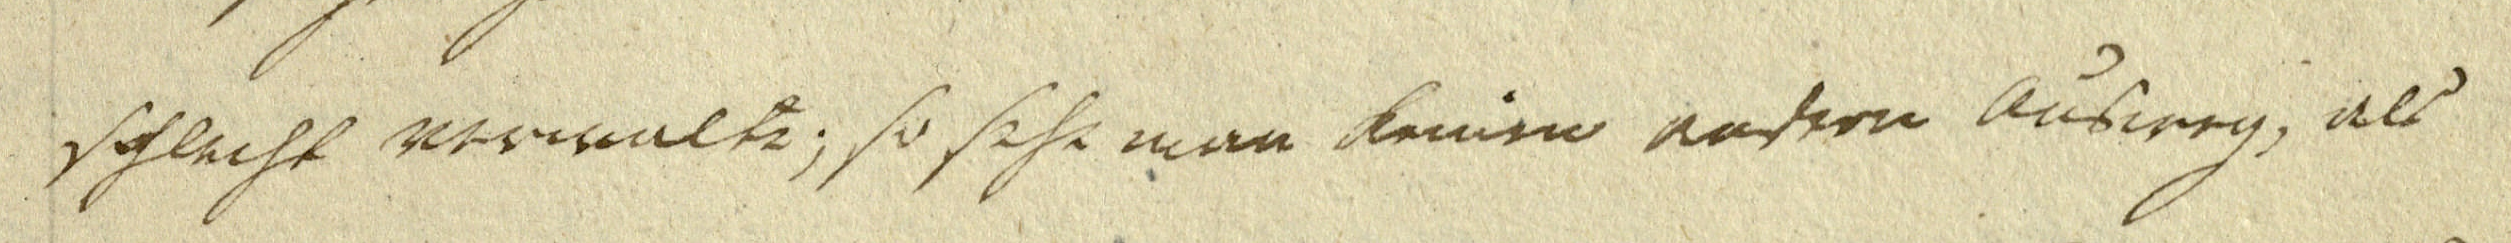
schlecht verwalte; so sehe man keinen andern Ausweg, als
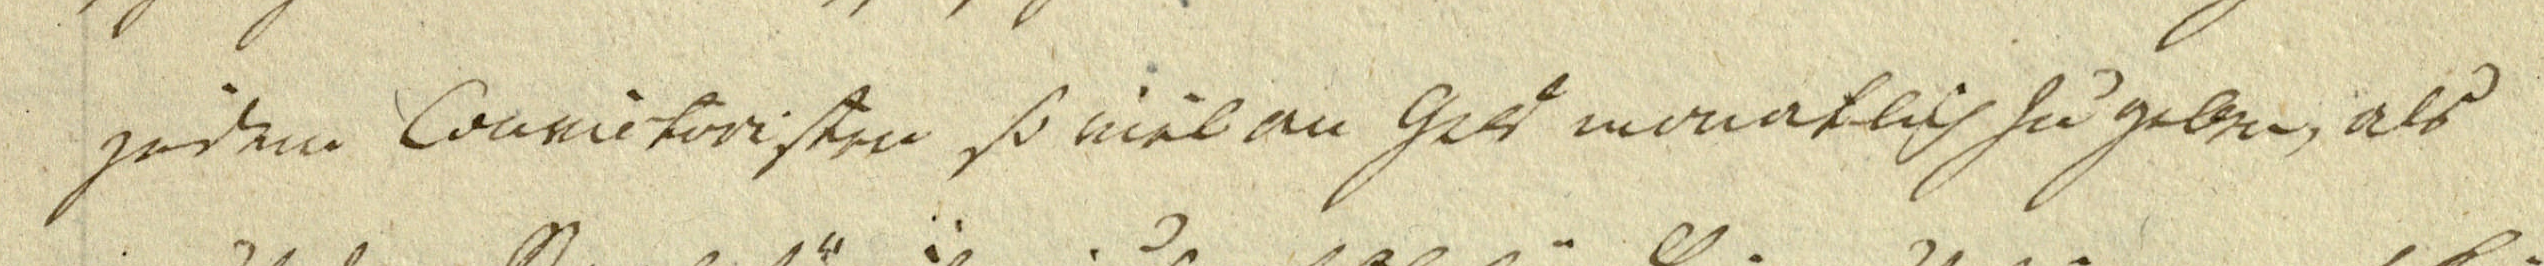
jedem Convictoristen so viel an Geld monatlich zu geben, als
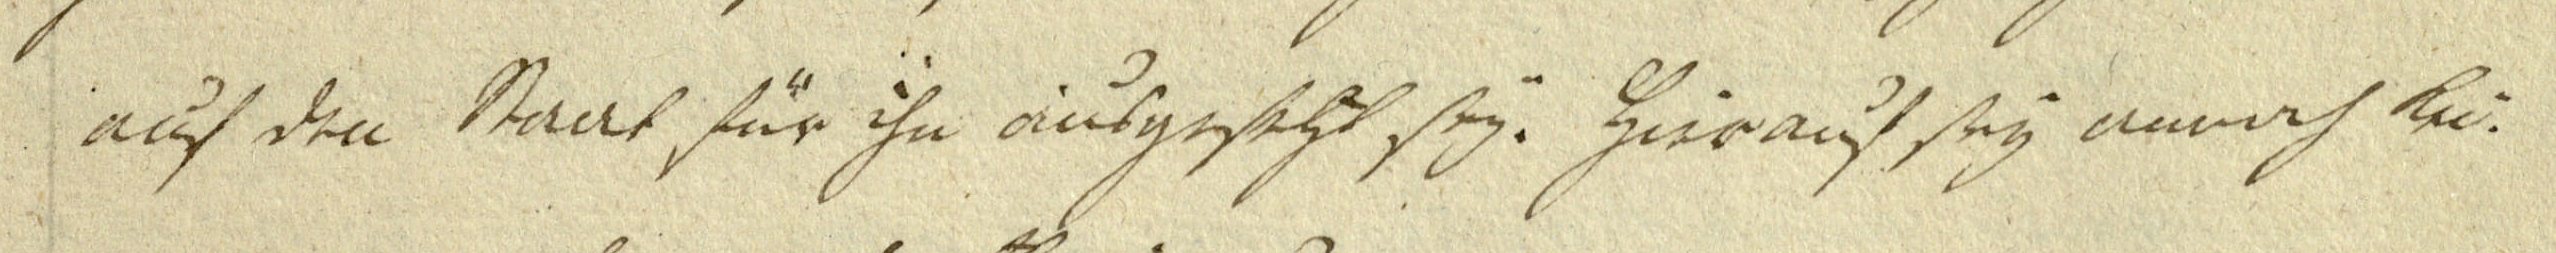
auf den Staat für ihn ausgesetzt seÿ. Hierauf seÿ annoch kei¬
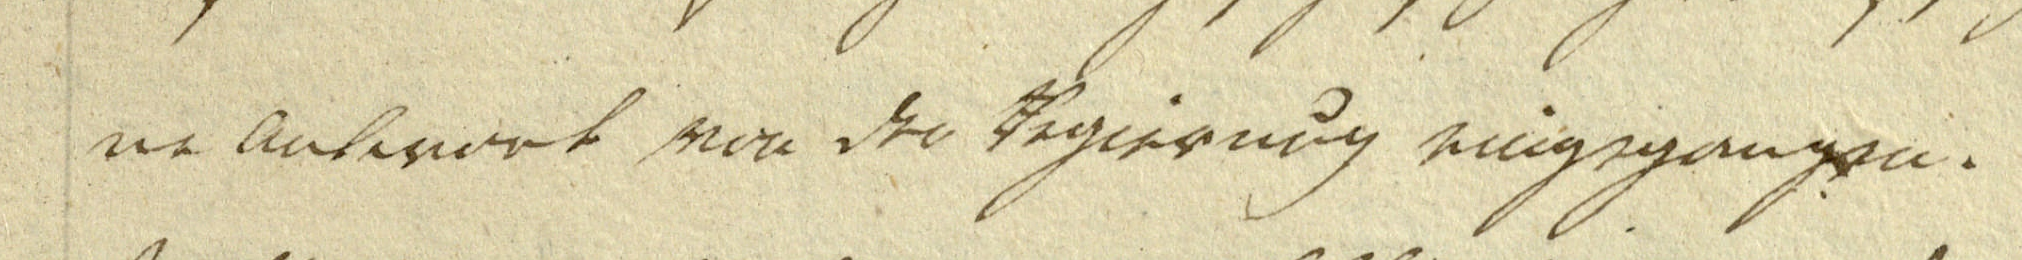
ne Antwort von der Regierung eingegangen.
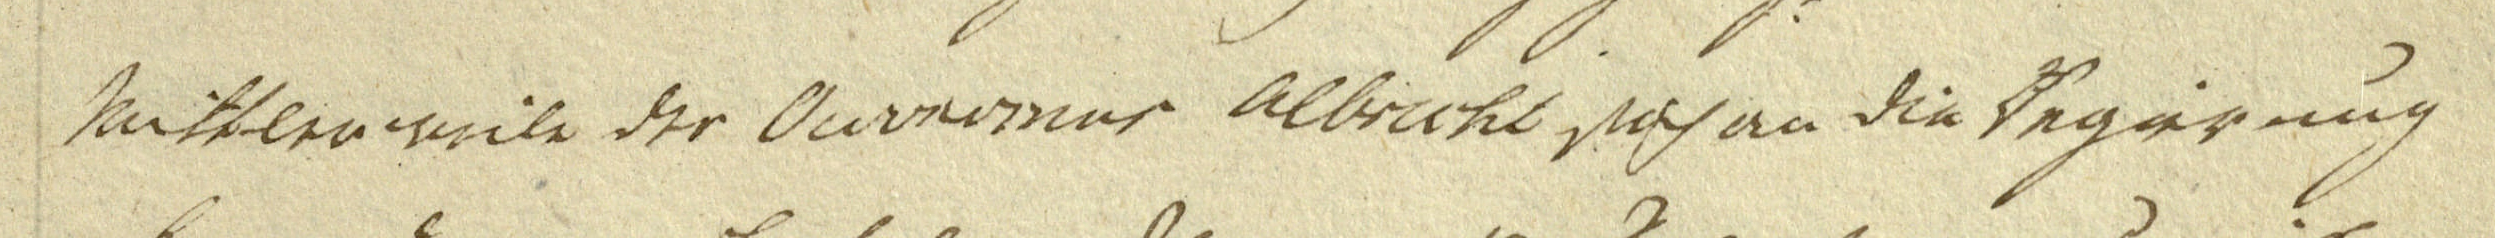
Mittlerweile der Oeconomus Albrecht sich an die Regierung
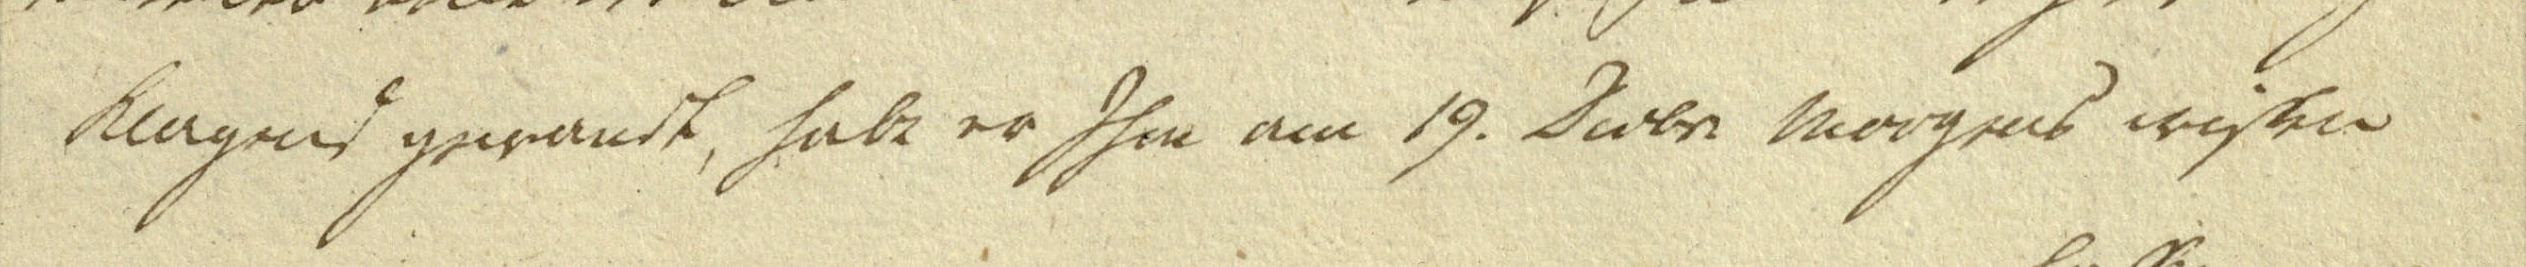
klagend gewandt, habe er Ihm am 19. Decbr. Morgens wissen
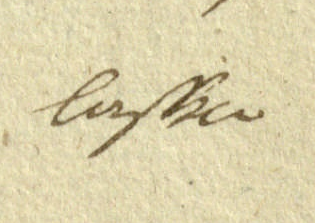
lassen
